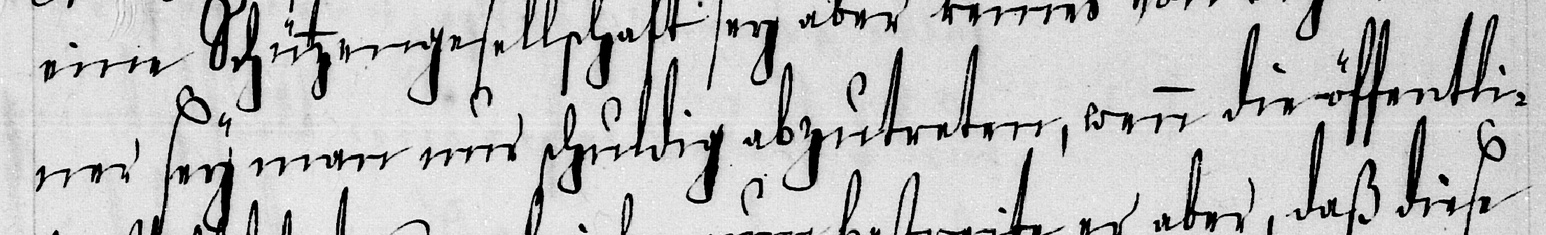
ner sey man nur schuldig abzutreten, wenn die öffentli¬
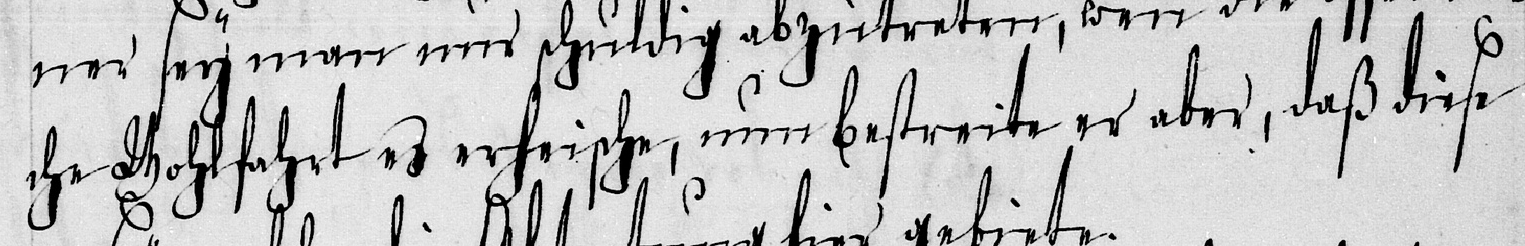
che Wohlfahrt es erheische, nun bestreite er aber, daß diese
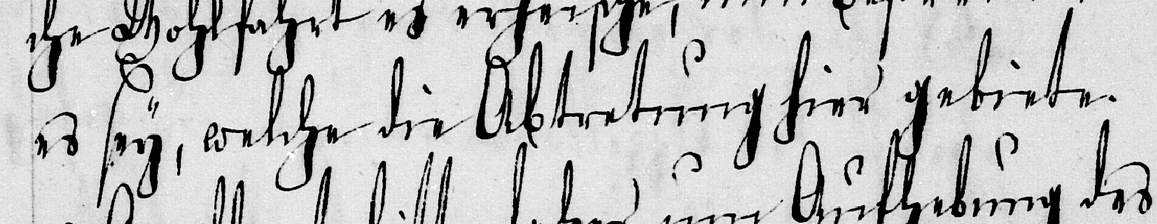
es sey, welche die Abtretung hier gebiete.
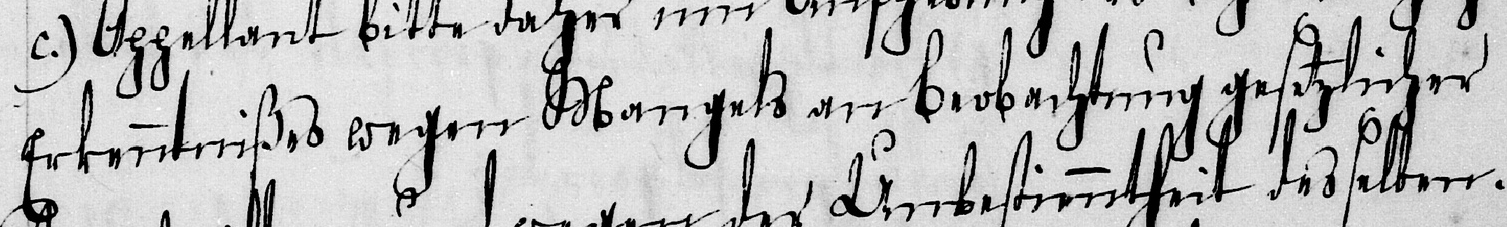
Erkenntnißes wegen Mangels an Beobachtung gesetzlicher
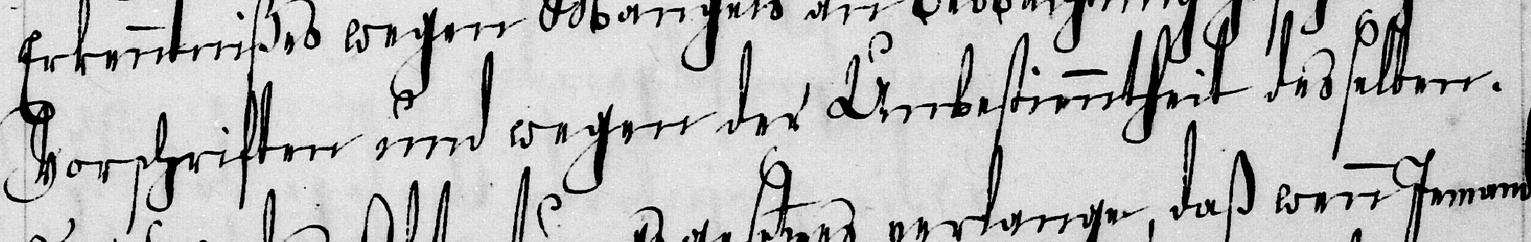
Vorschriften und wegen der Unbestimmtheit desselben.
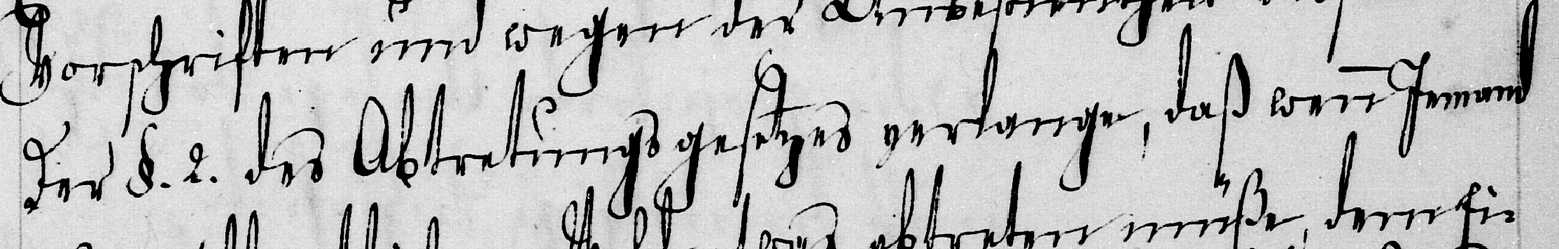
Der §. 2. des Abtretungsgesetzes verlange, daß wenn Jemand
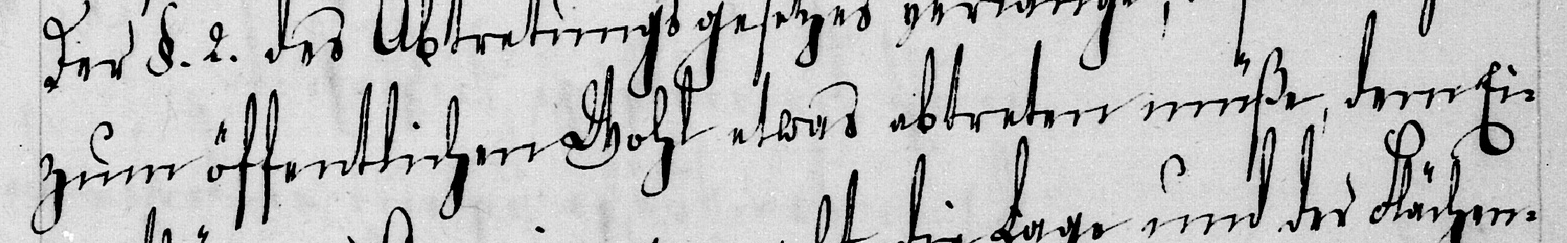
zum öffentlichen Wohl etwas abtreten müße, dem Ei¬
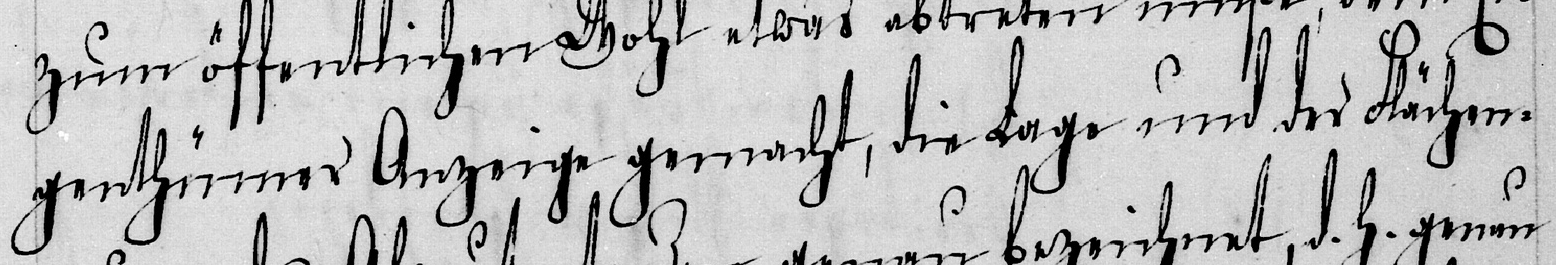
genthümer Anzeige gemacht, die Lage und der Fläche¬
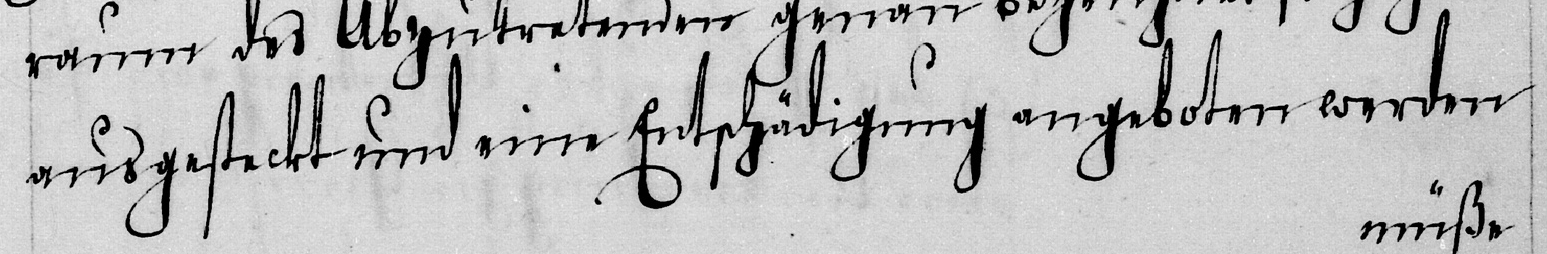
ausgesteckt und eine Entschädigung angeboten werden
